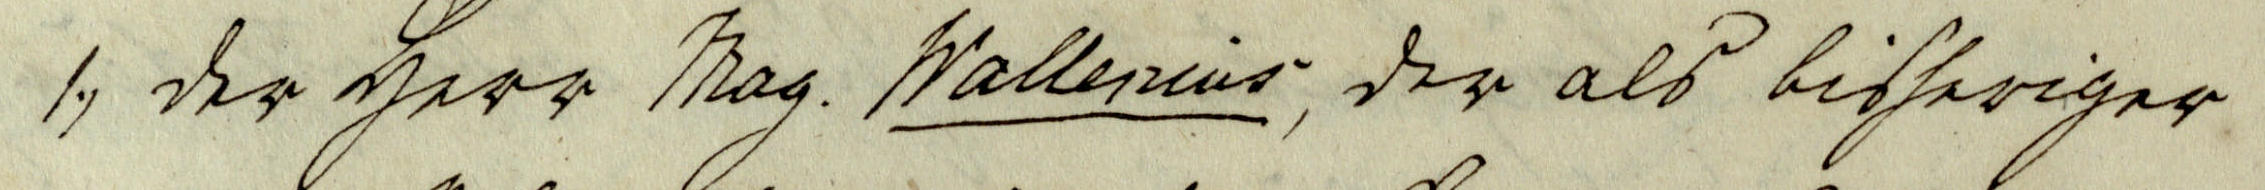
1., der Herr Mag. Wallenius, der als bisheriger
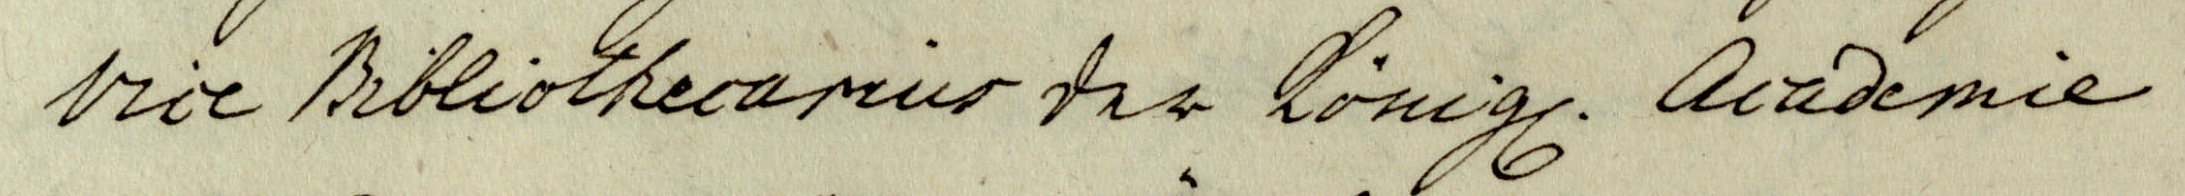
Vice Bibliothecarius der Königl. Academie
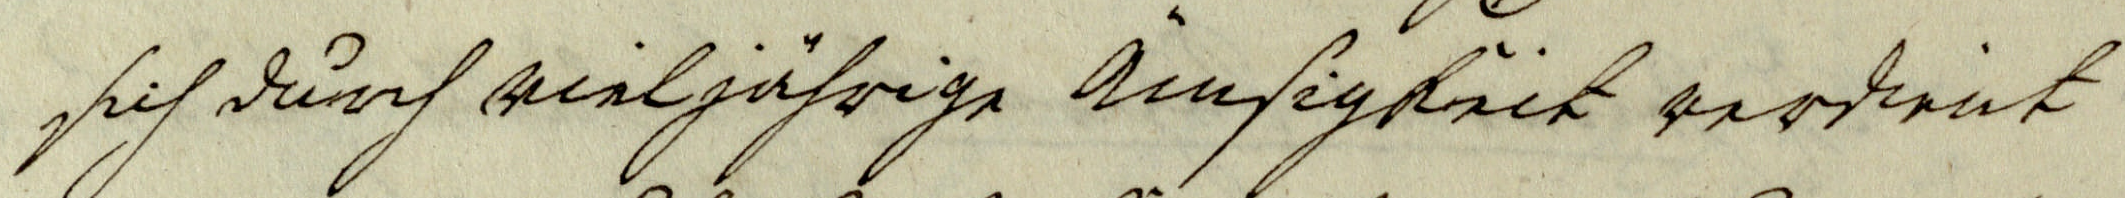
sich durch vieljährige Ämsigkeit verdient
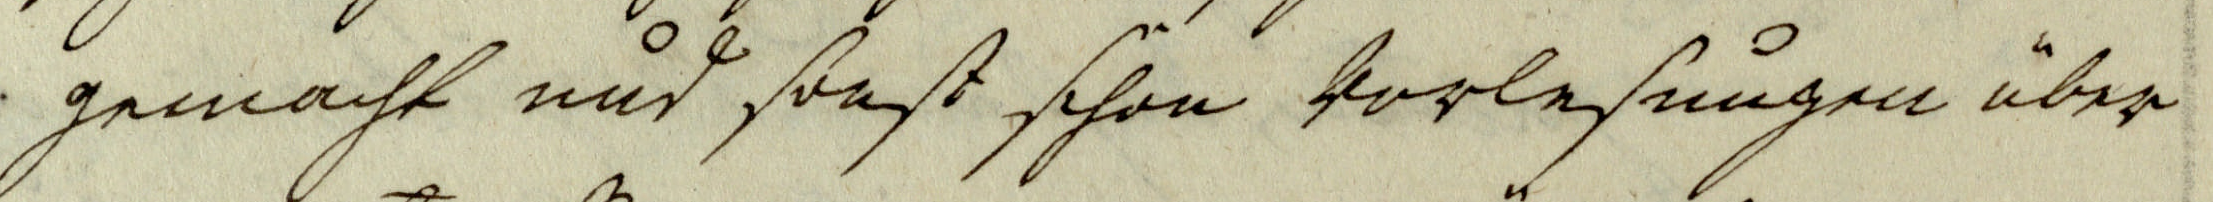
gemacht und sonst schon Vorlesungen über
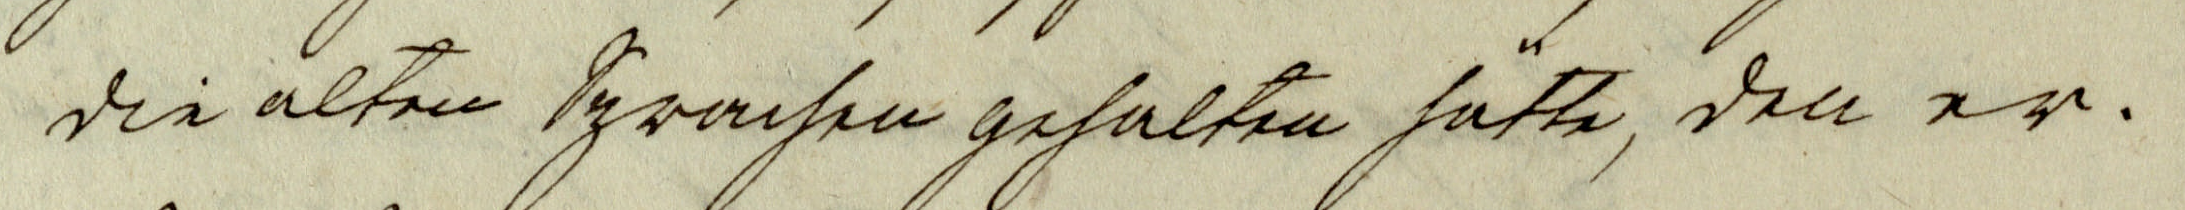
die alten Sprachen gehalten hätte, den er¬
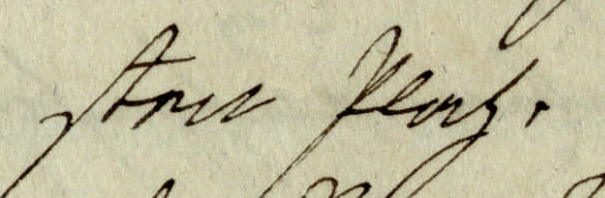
sten Platz.
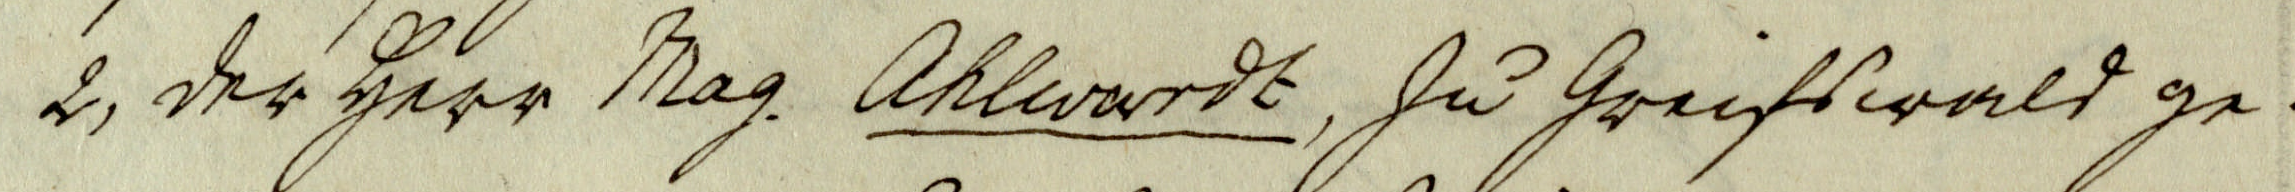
2., der Herr Mag. Ahlwardt, zu Greifswald ge¬
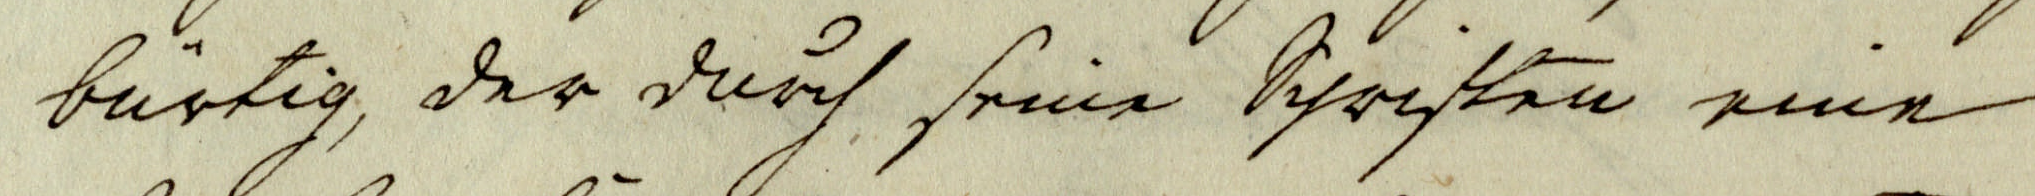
bürtig, der durch seine Schriften eine
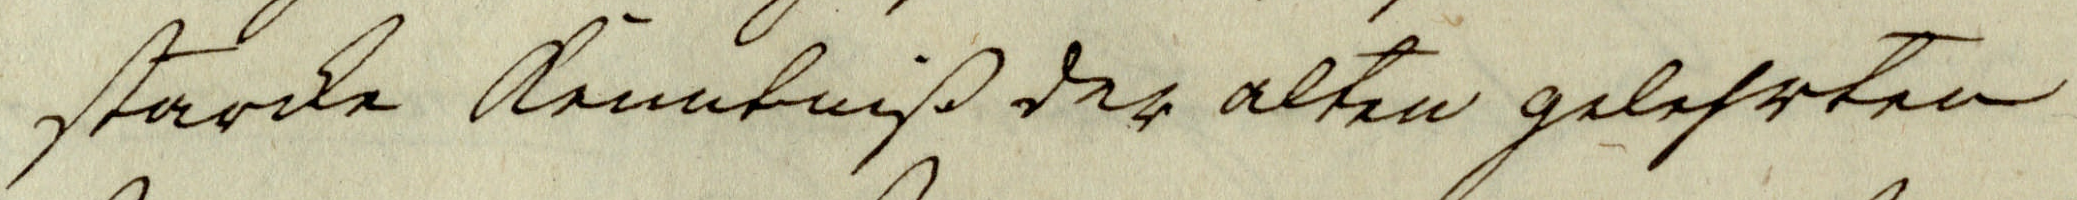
starcke Kenntniß der alten gelehrten
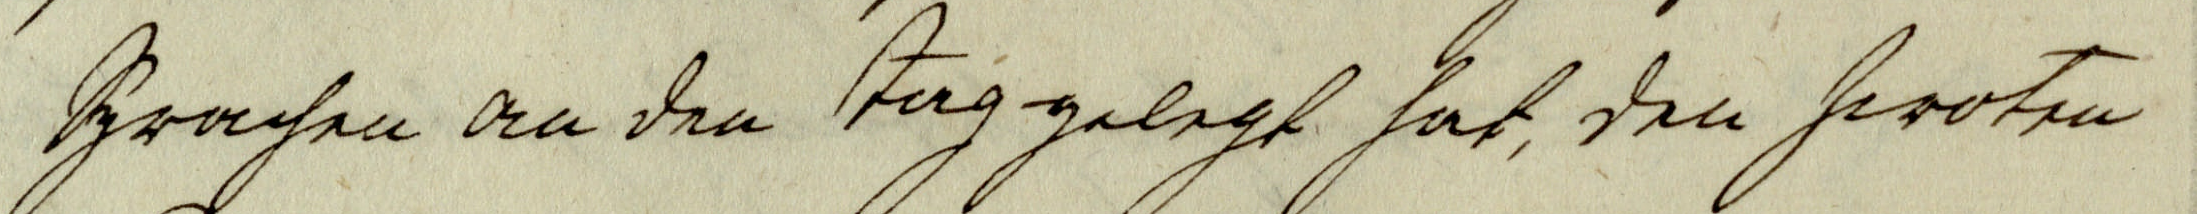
Sprachen an den Tag gelegt hat, den zwoten
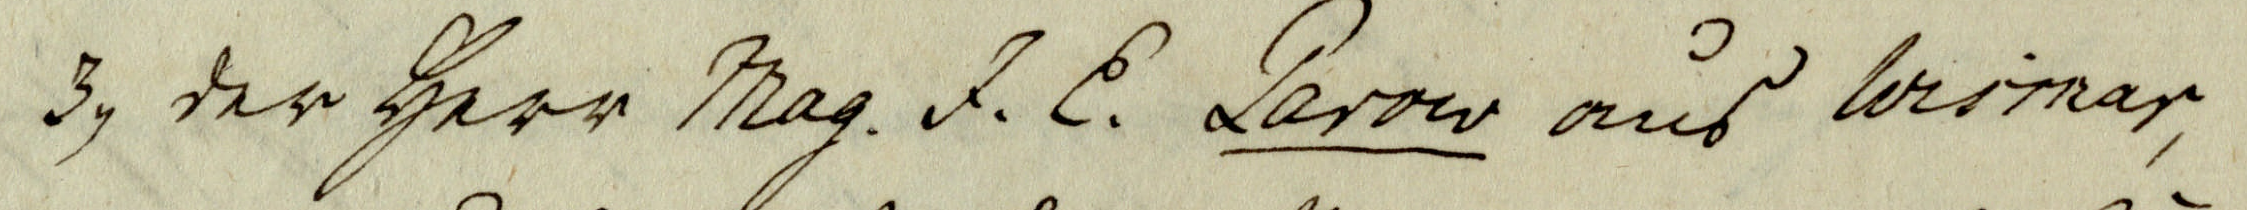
3., der Herr Mag. I. E. Larow aus Wismar,
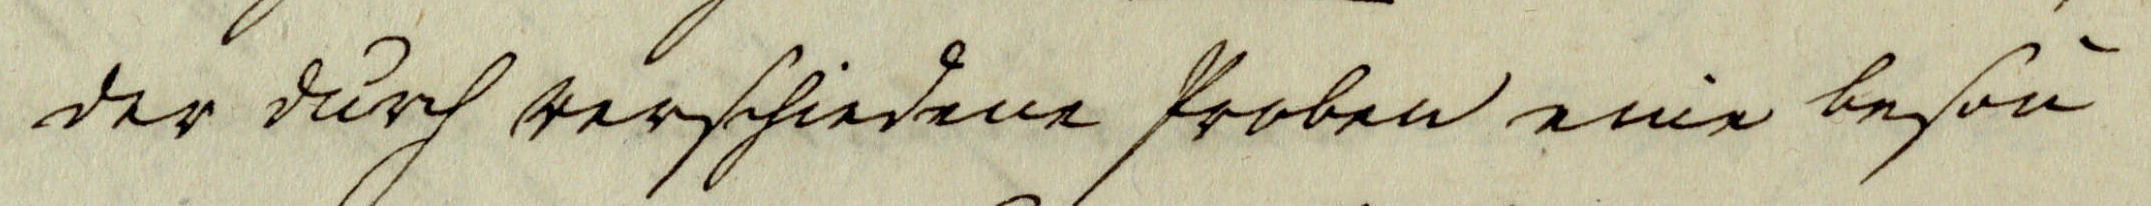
der durch verschiedene Proben eine beson¬
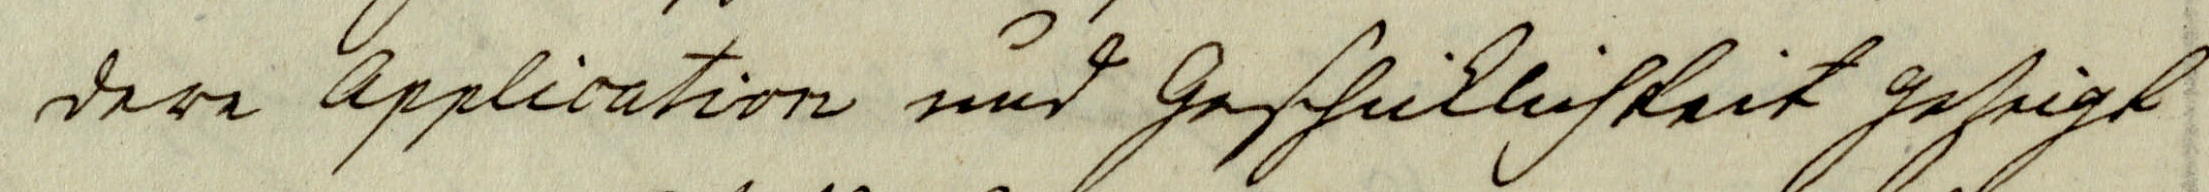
dere Application und Geschicklichkeit gezeigt
